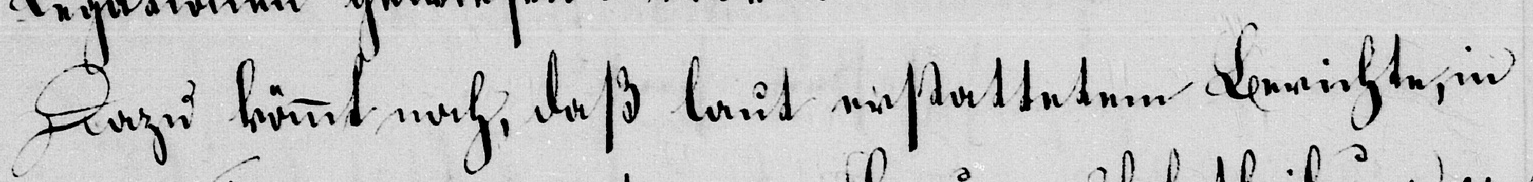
Dazu kömmt noch, daß laut erstattetem Berichte, in
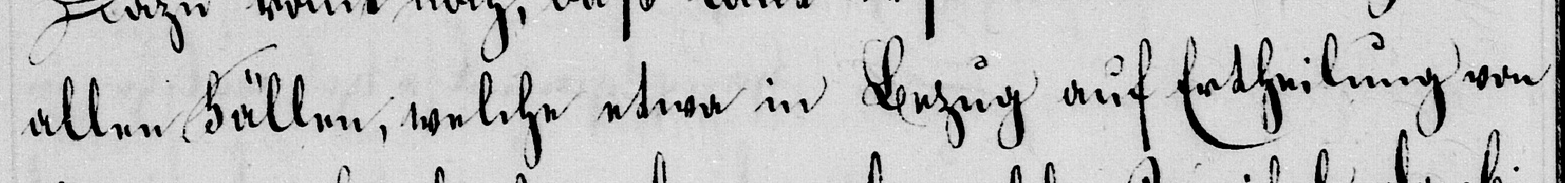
allen Fällen, welche etwa in Bezug auf Ertheilung von
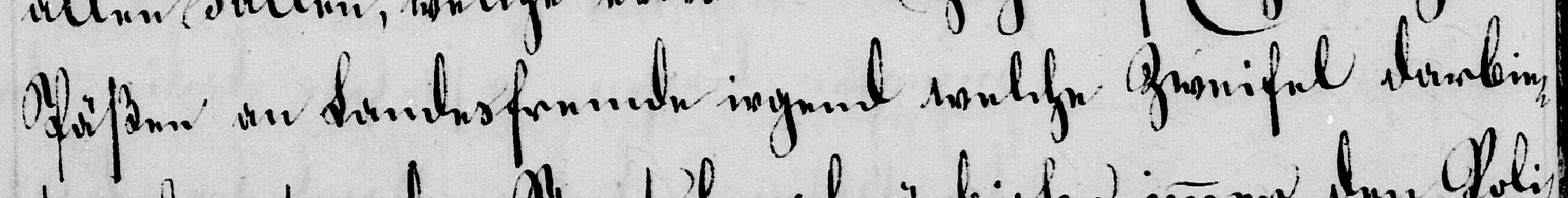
Päßen an Landesfremde irgend welche Zweifel darbie¬
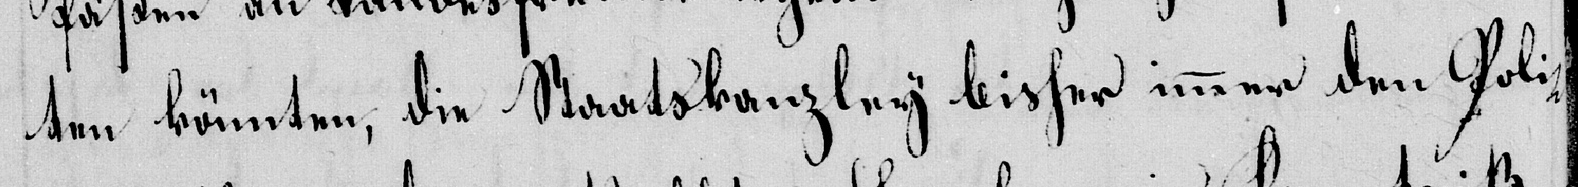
ten könnten, die Staatskanzley bisher immer den Poli¬
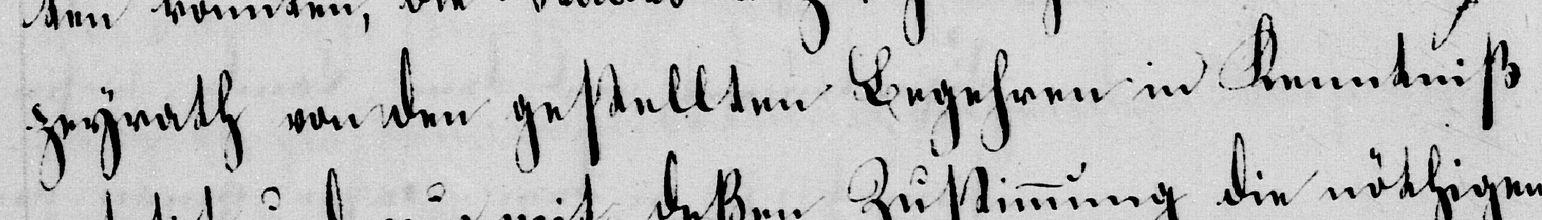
zeyrath von den gestellten Begehren in Kenntniß
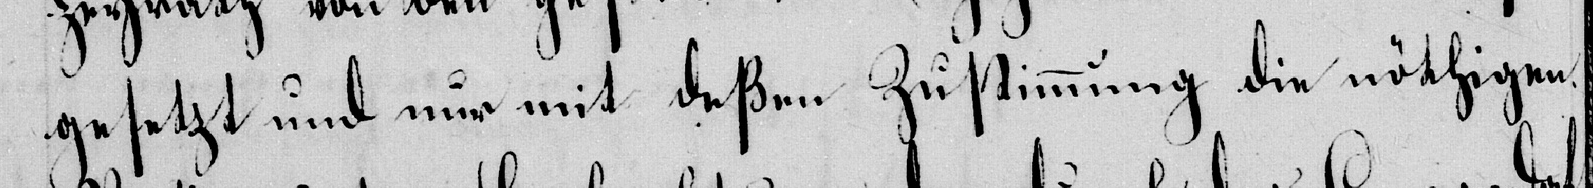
gesetzt und nur mit deßen Zustimmung die nöthigen
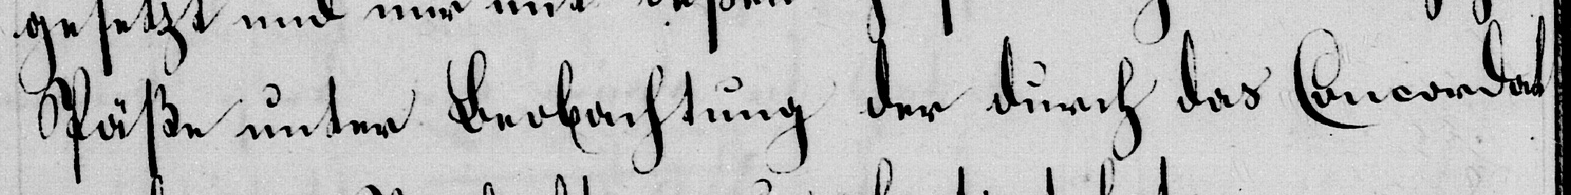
Päße unter Beobachtung der durch das Concordat
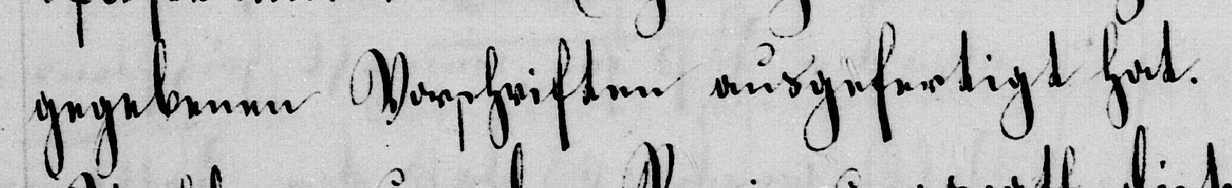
gegebenen Vorschriften ausgefertigt hat.
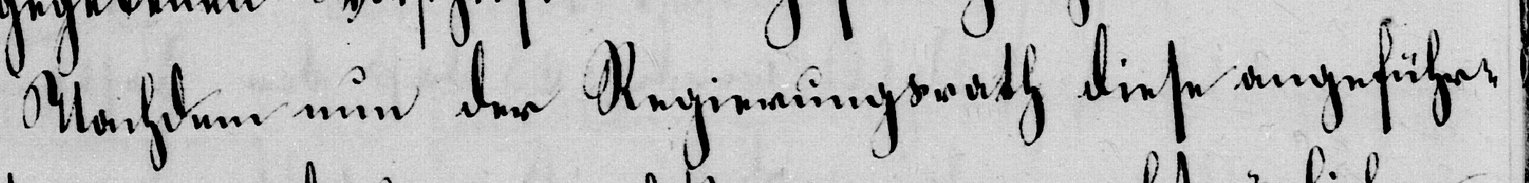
Nachdem nun der Regierungsrath diese angeführ¬
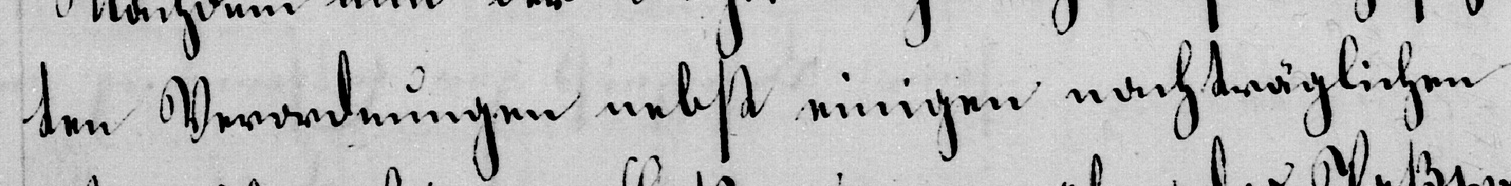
ten Verordnungen nebst einigen nachträglichen
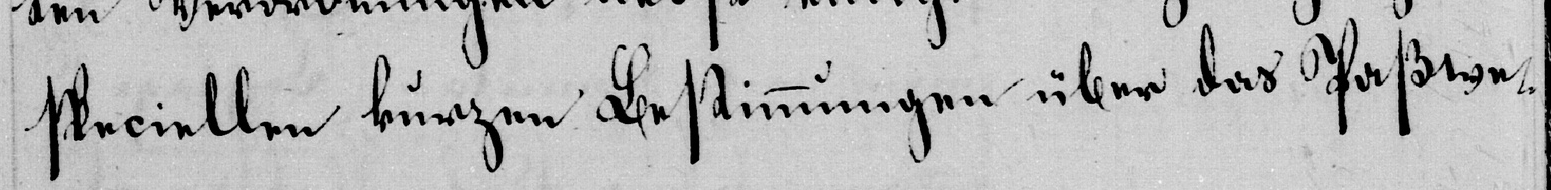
speciellen kurzen Bestimmungen über das Paßwe-
